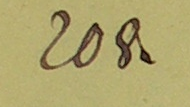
208
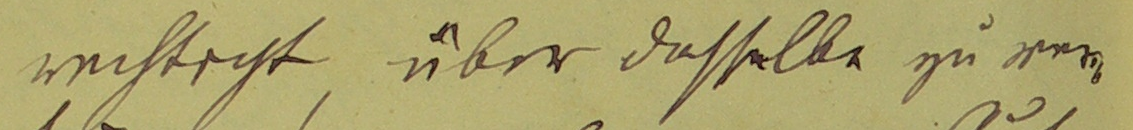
über dasselbe zu ver¬
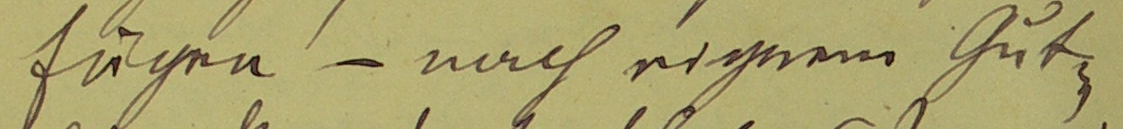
fügen !- nach eigenem Gut¬
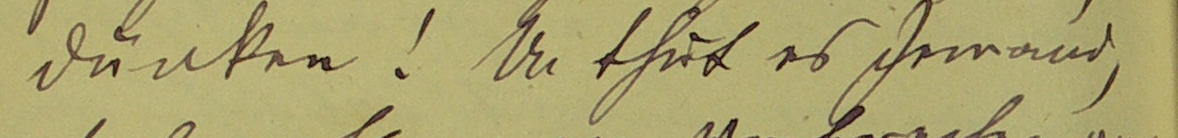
dünken ! –Und tuth es Jemand,
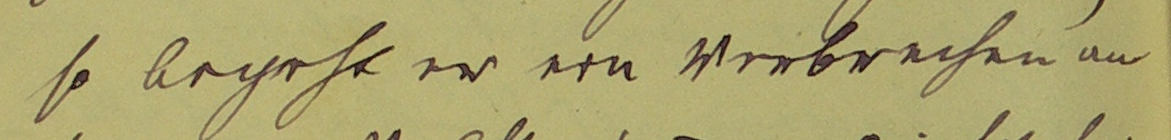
so begeht er ein Verbrechen an
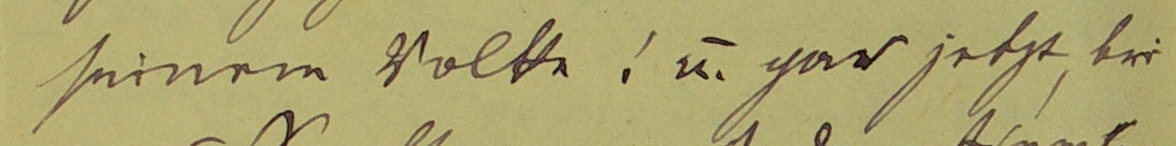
seinem Volke!- und gar jetzt, bei
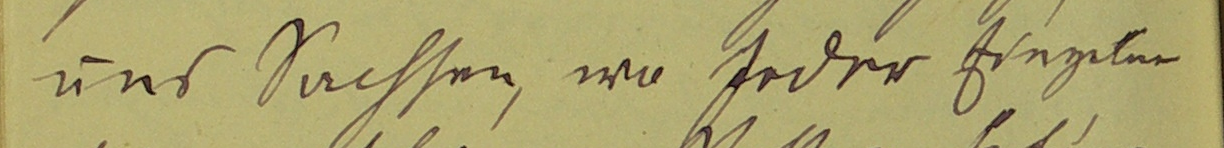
uns Sachsen, wo jeder Einzelne
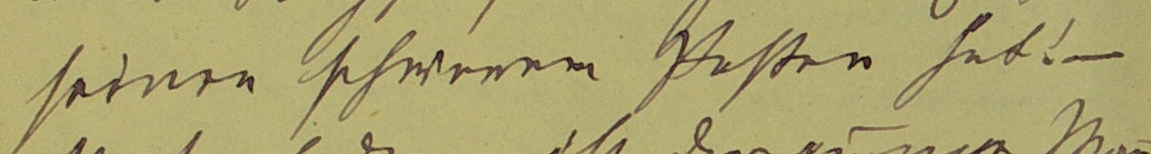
seinen schweren Posten hat!-
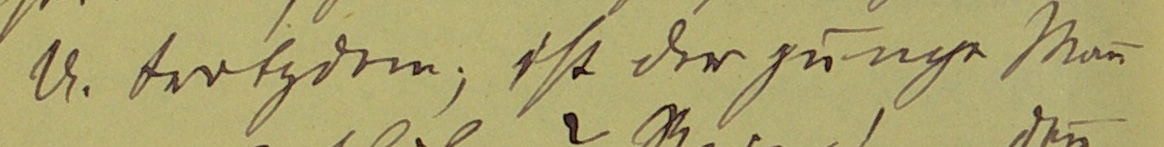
Und trotzdem, ist der junge Mann
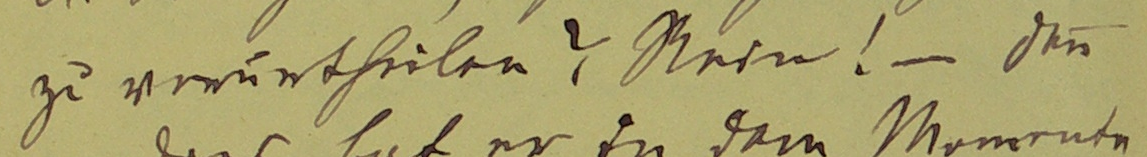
zu verurtheilen ? Nein !- denn
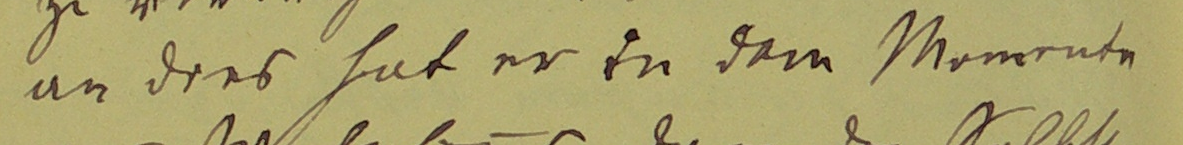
an dies hat er in dem Moment
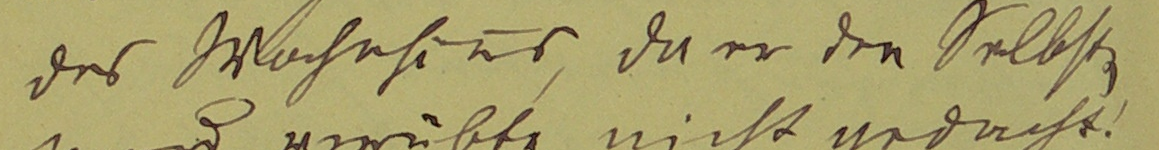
des Wahnsinns da er den Selbst¬
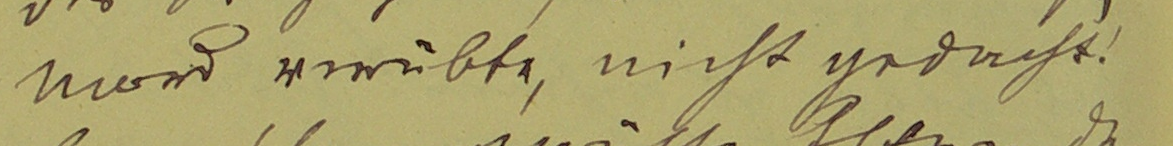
mord verübte, nicht gedacht !-
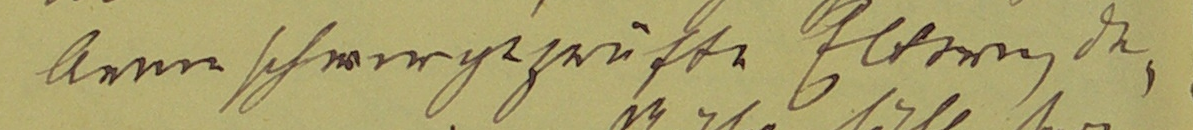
Denn schwergeprüften Eltern de¬
